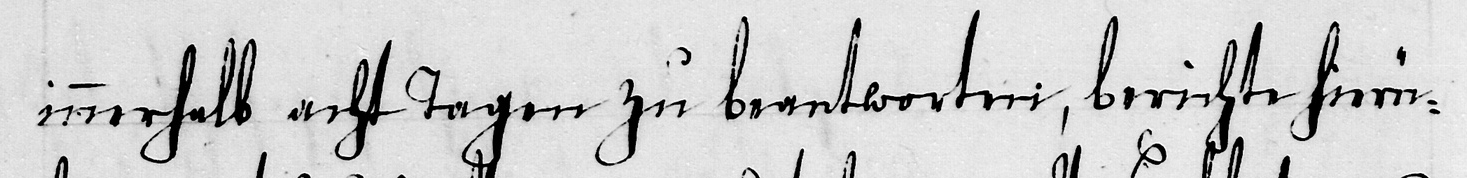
innerhalb acht Tagen zu beantworten, berichte hierü¬
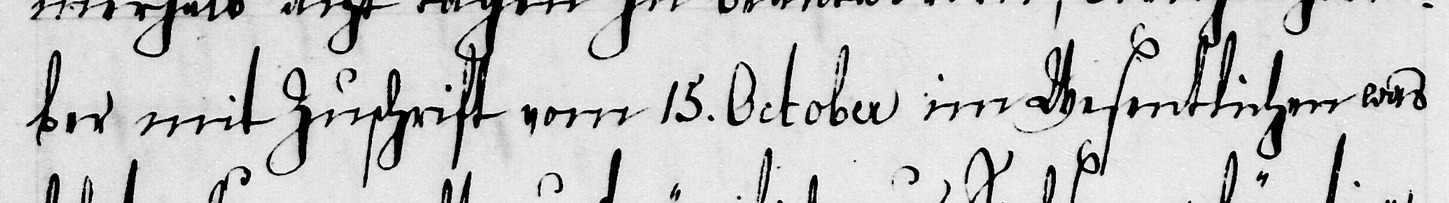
ber mit Zuschrift vom 15. October im Wesentlichen was
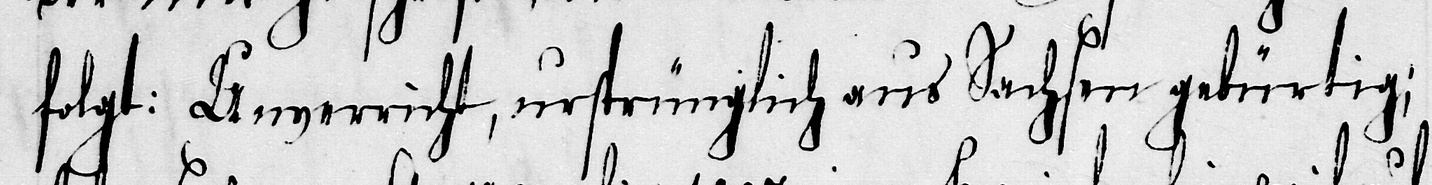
folgt: Unverricht, ursprünglich aus Sachsen gebürtig,
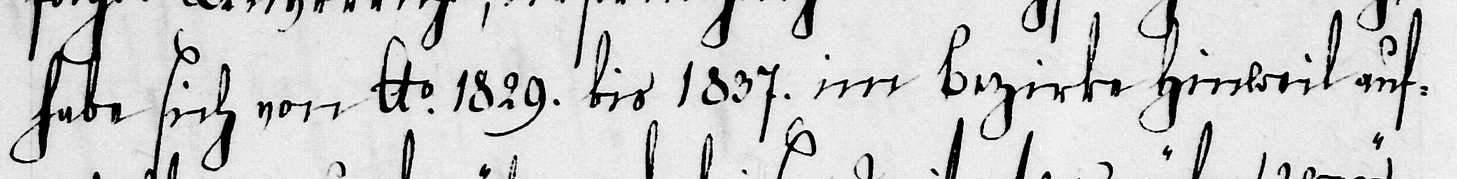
habe sich von Ao. 1829. bis 1837. im Bezirke Hinweil auf¬
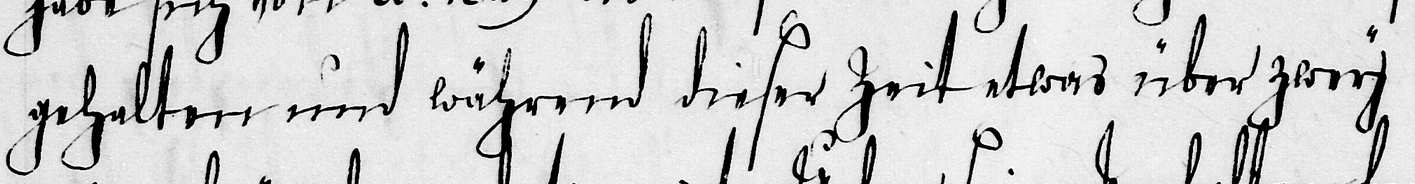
gehalten und während dieser Zeit etwas über zwey
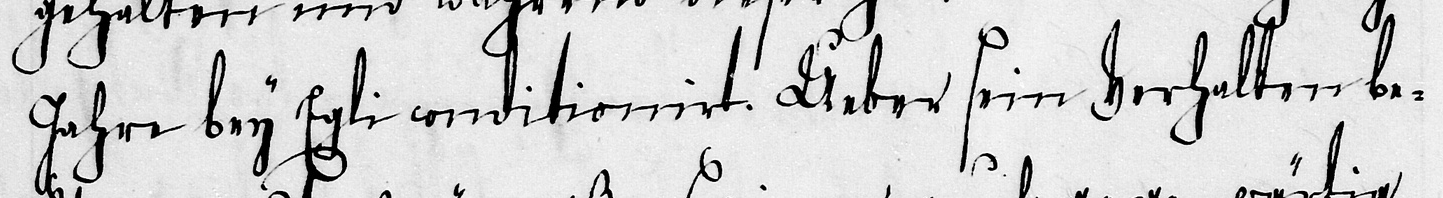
Jahre bey Egli conditionirt. Ueber sein Verhalten be¬
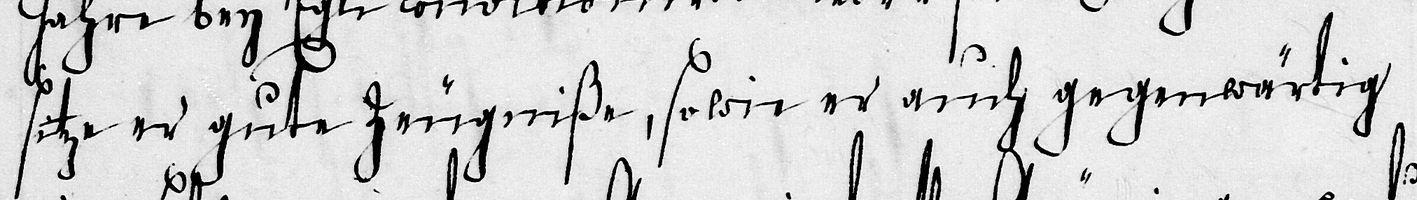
sitze er gute Zeugniße, sowie er auch gegenwärtig
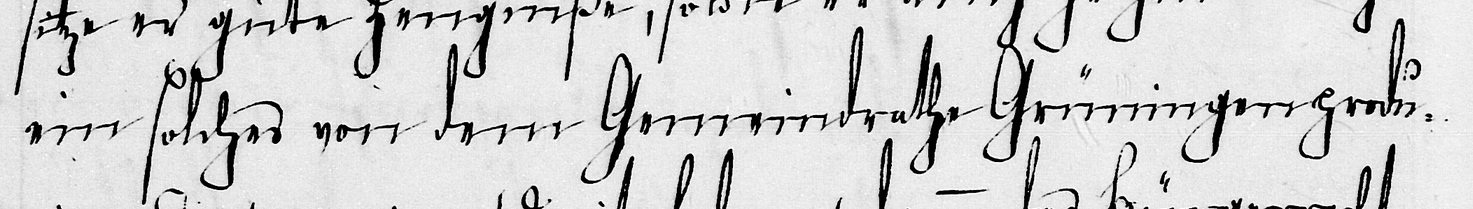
ein solches von dem Gemeindrathe Grüningen produ¬
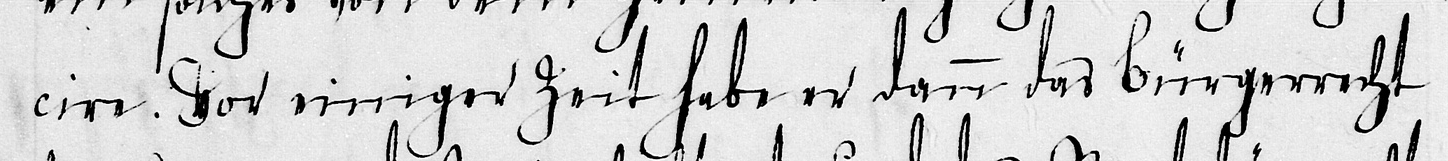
cire. Vor einiger Zeit habe er dann das Bürgerrecht
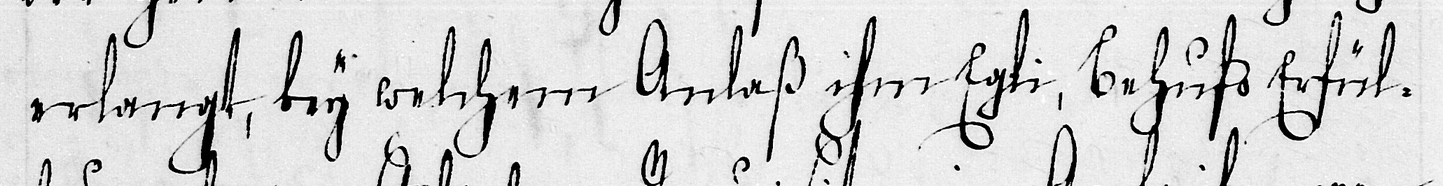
erlangt, bey welchem Anlaß ihm Egli, Behufs Erfül¬
